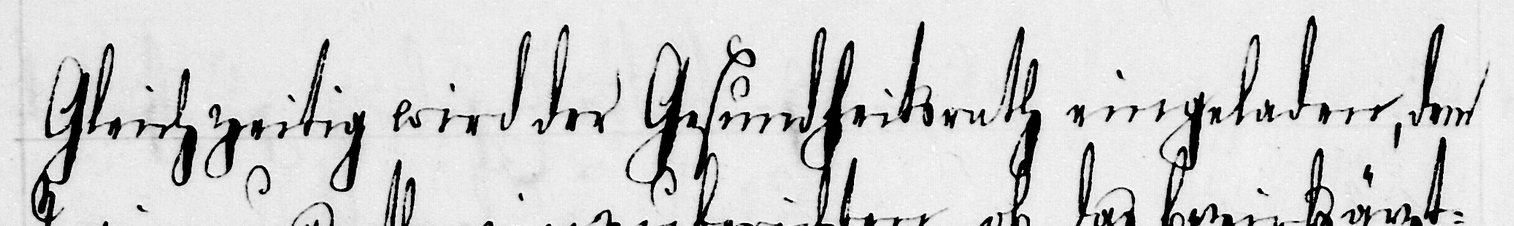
Gleichzeitig wird der Gesundheitsrath eingeladen, dem
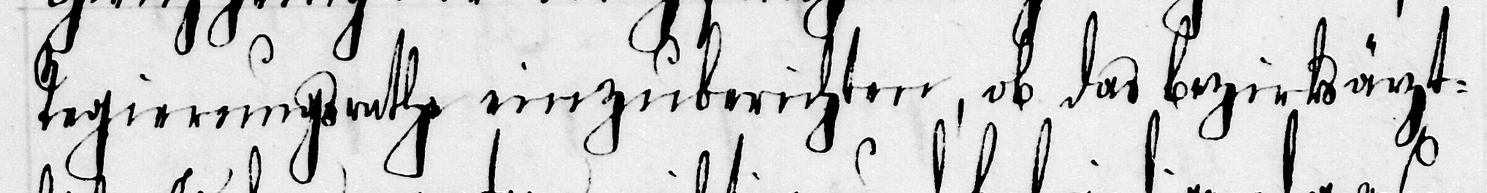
Regierungsrathe einzuberichten, ob das bezirksärzt¬
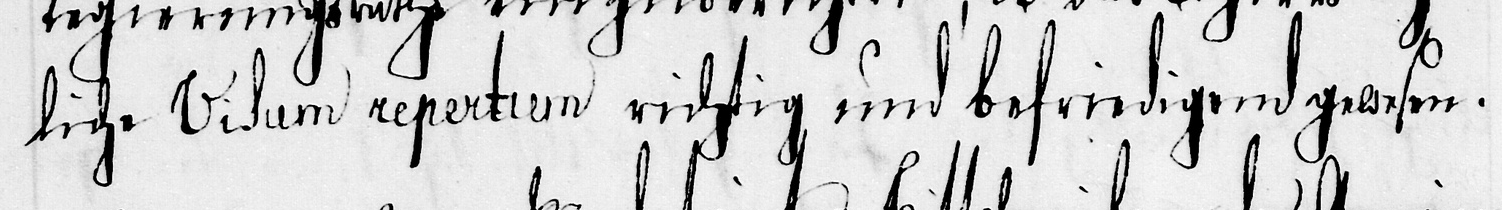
liche Visum repertum richtig und befriedigend gewesen.
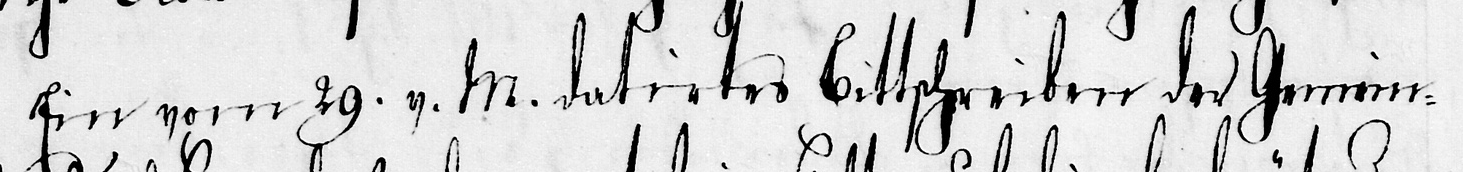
Ein vom 29. v. M. datirtes Bittschreiben der Gemein¬
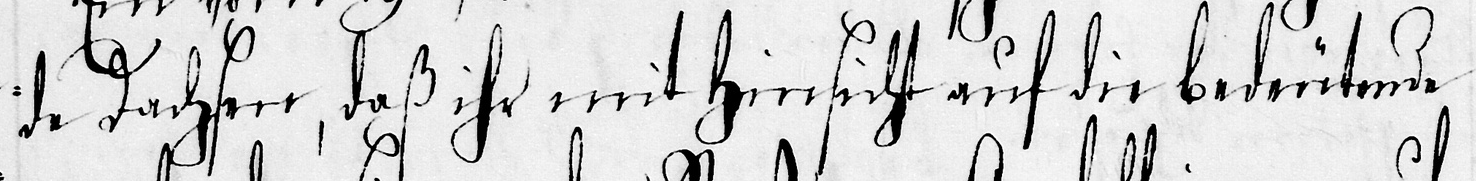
de Dachsen, daß ihr mit Hinsicht auf die bedeutende
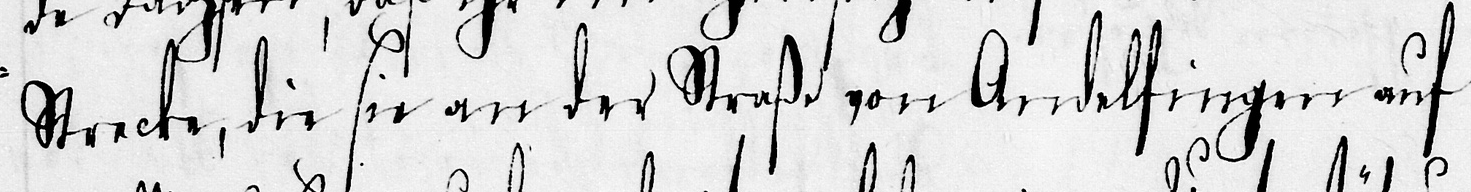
Strecke, die sie an der Straße von Andelfingen auf
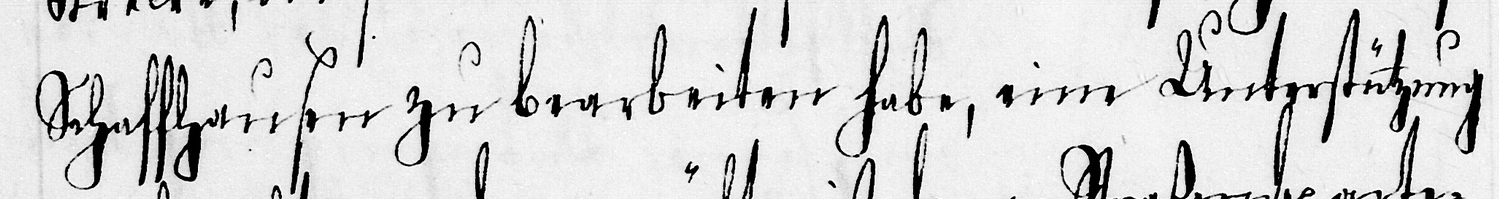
Schaffhausen zu bearbeiten habe, eine Unterstützung
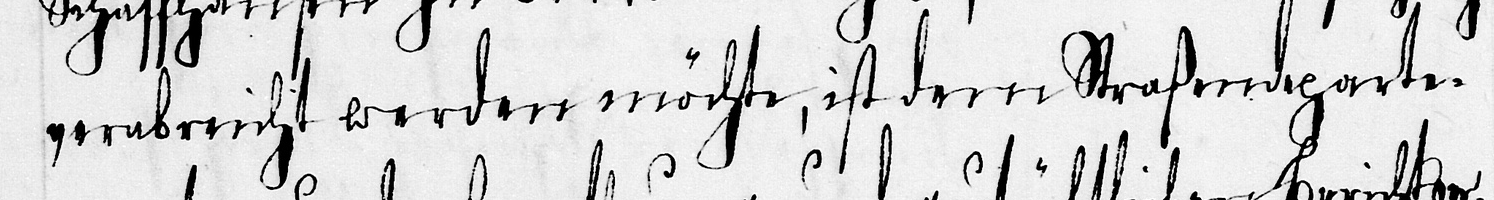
verabreicht werden möchte, ist dem Straßendeparte¬
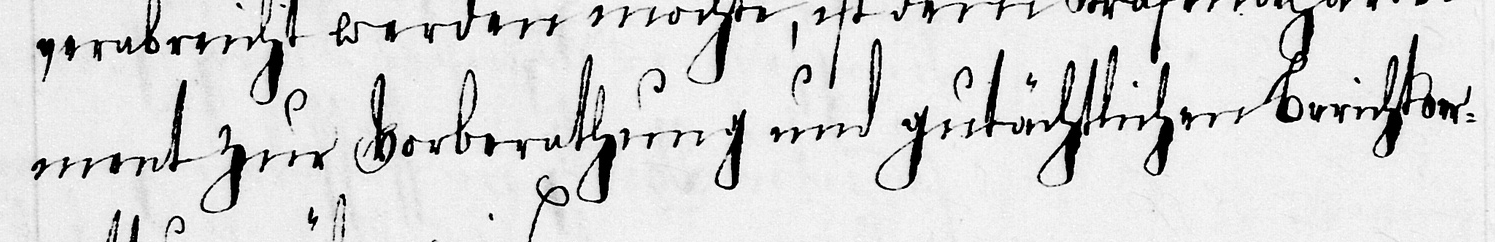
ment zur Vorberathung und gutächtlichen Berichtse¬
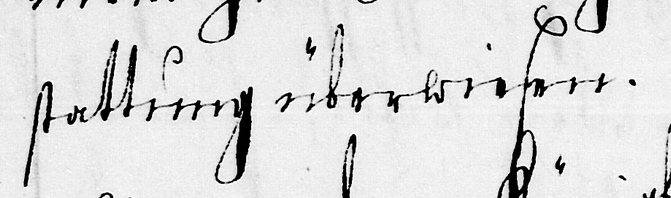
rstattung überwiesen.
